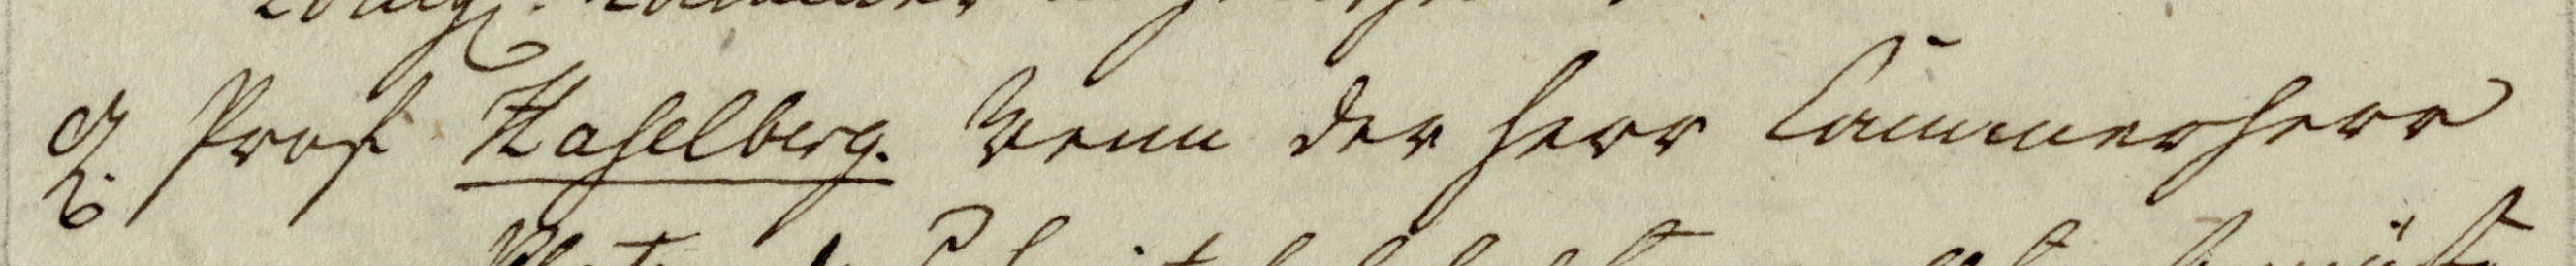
dh. Prof. Haselberg. Wenn der Herr Cammerherr
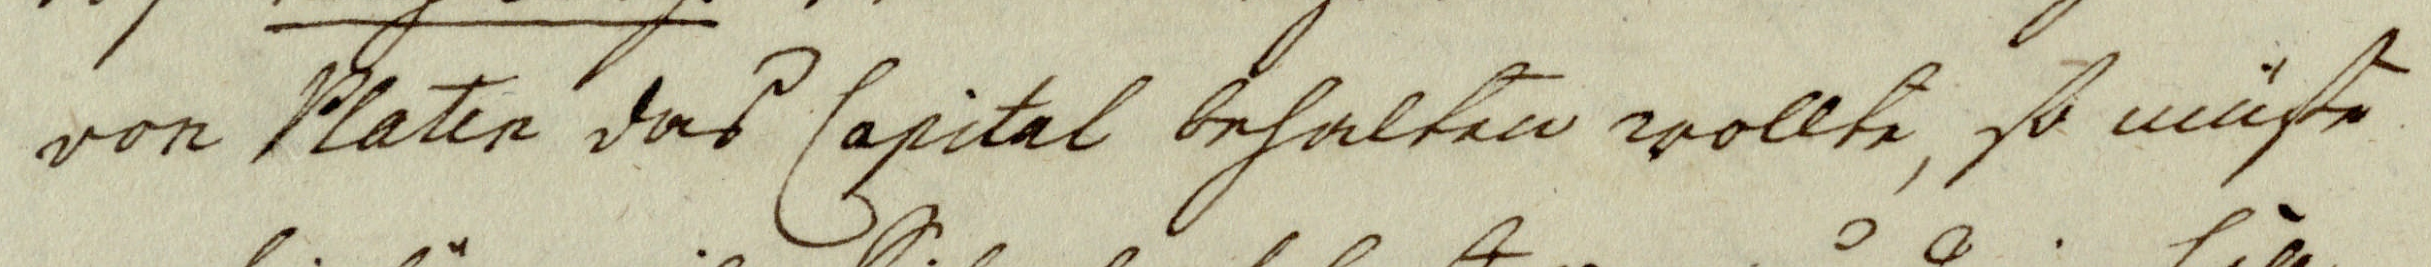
von Platen das Capital behalten wollte, so müßte
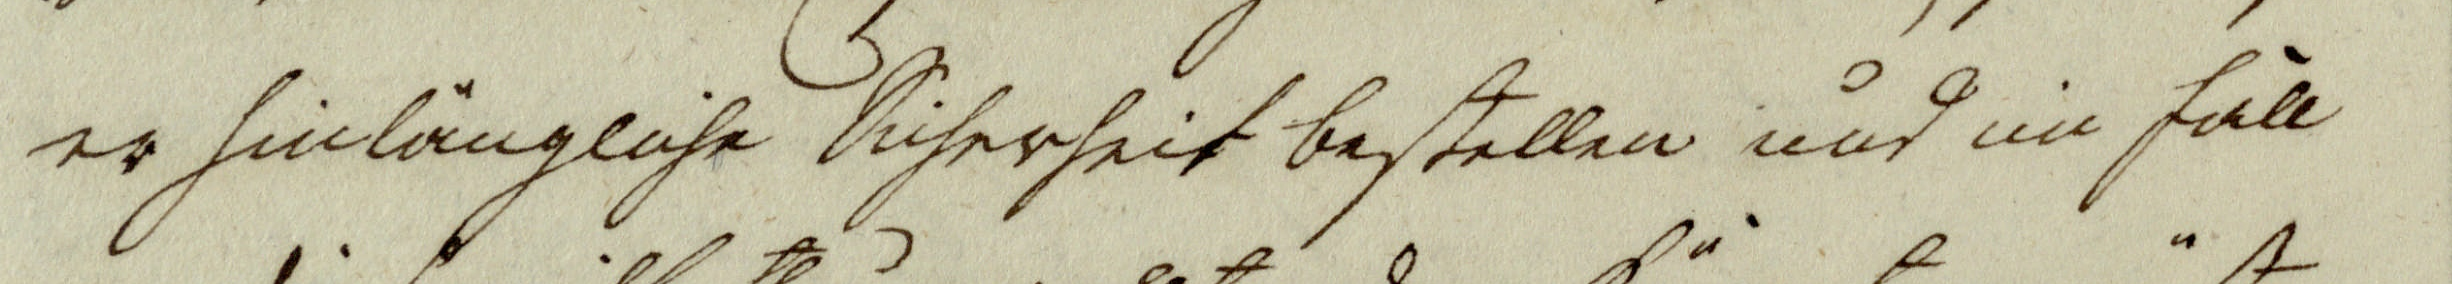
er hinlängliche Sicherheit bestellen und im Fall
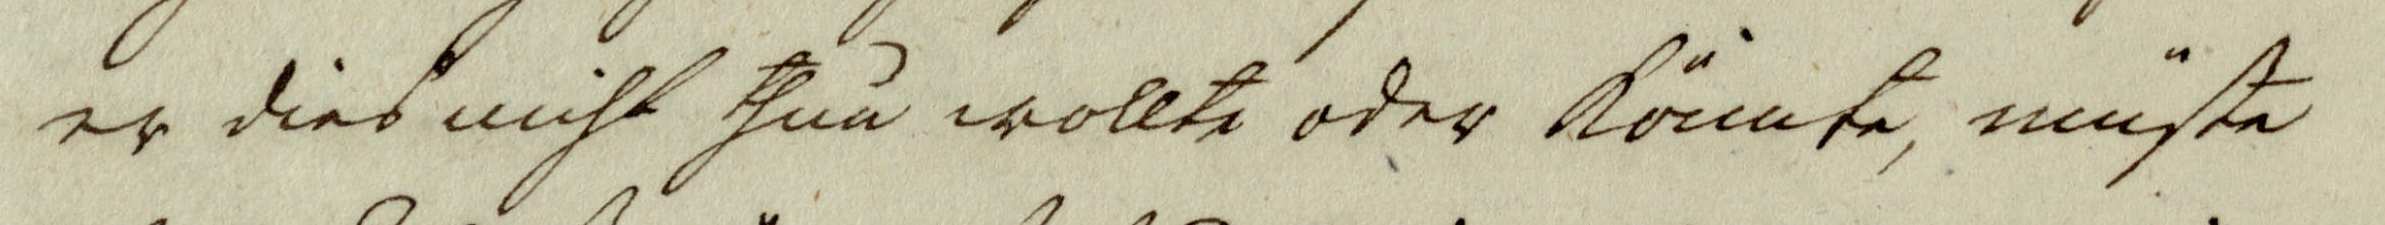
er dies nicht thun wollte der könnte, müßte
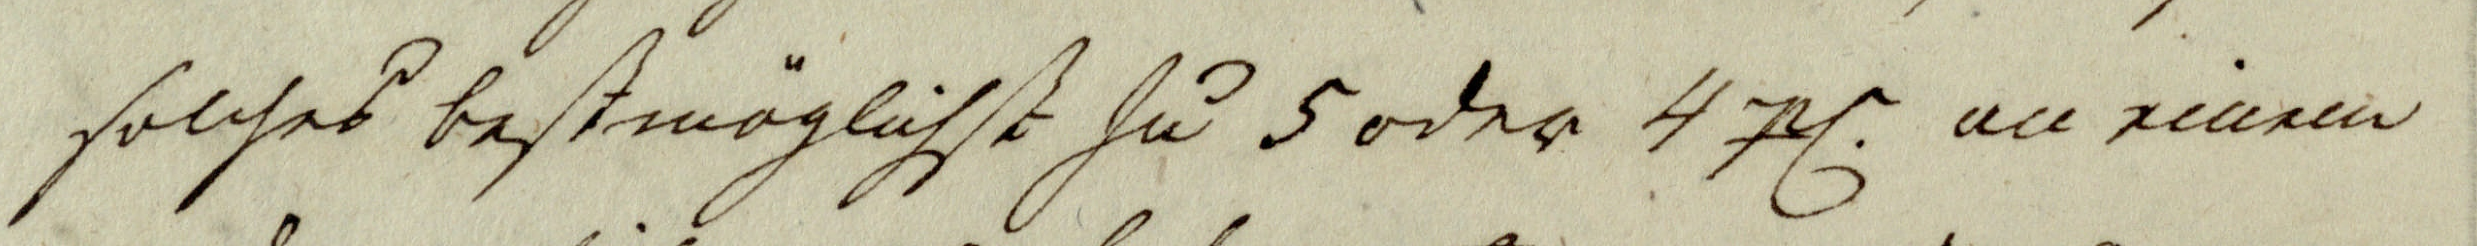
solches bestmöglichst zu 5 oder 4 pl. an einem
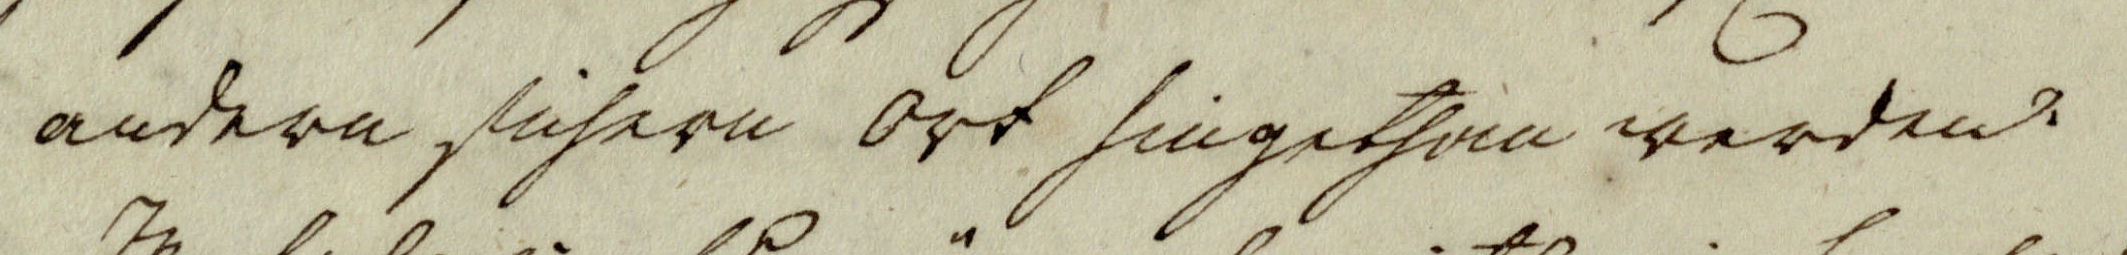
andern sichern Ort hingethan werden.
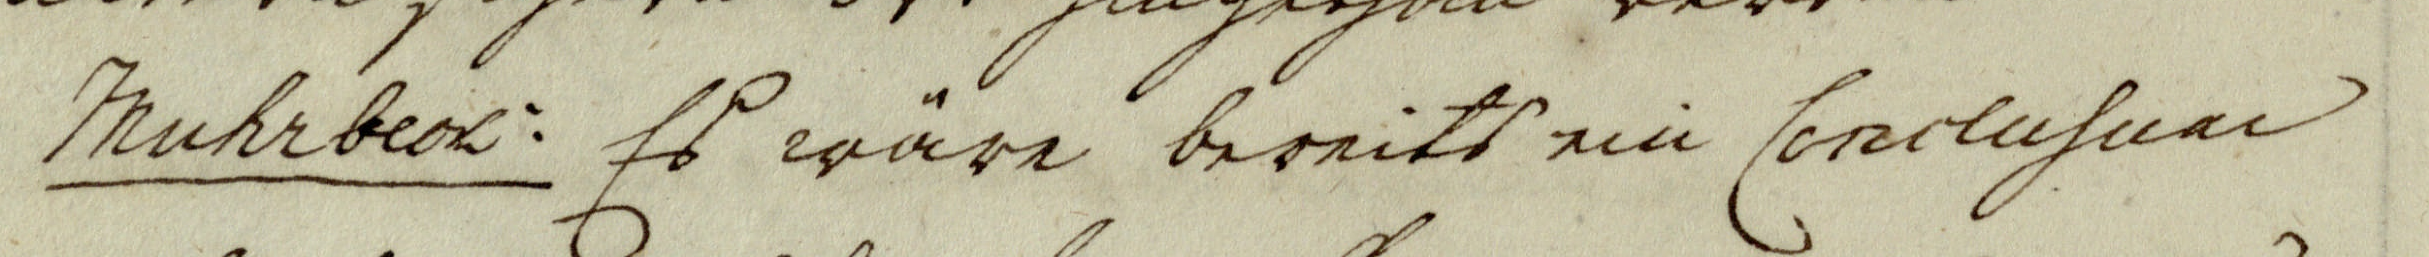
Muhrbeck. Es wäre bereits ein Conclusum
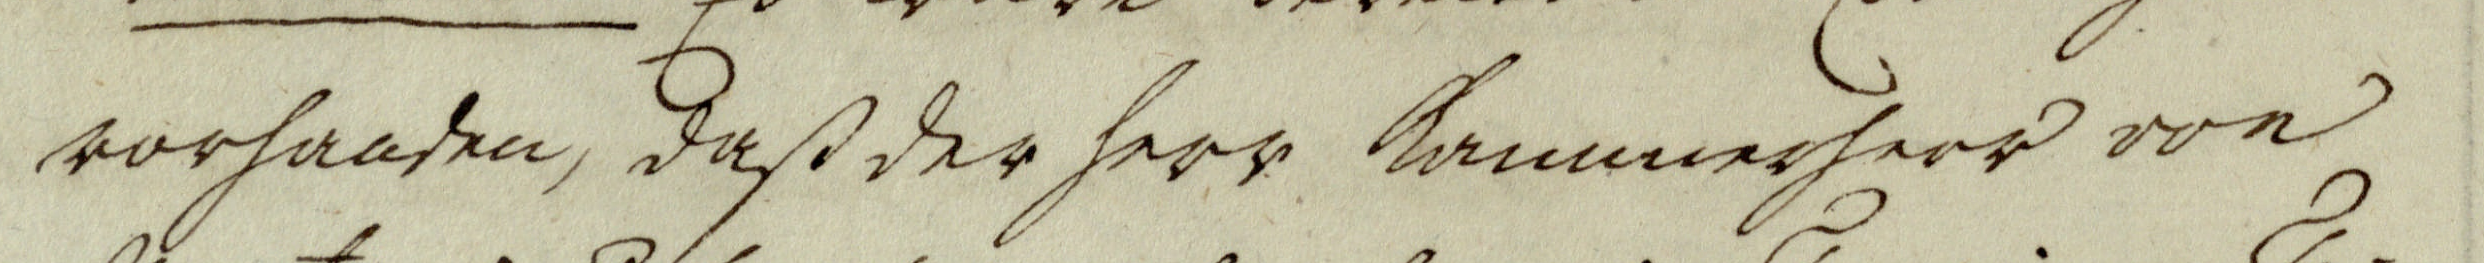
vorhanden, daß der Herr Kammerherr von
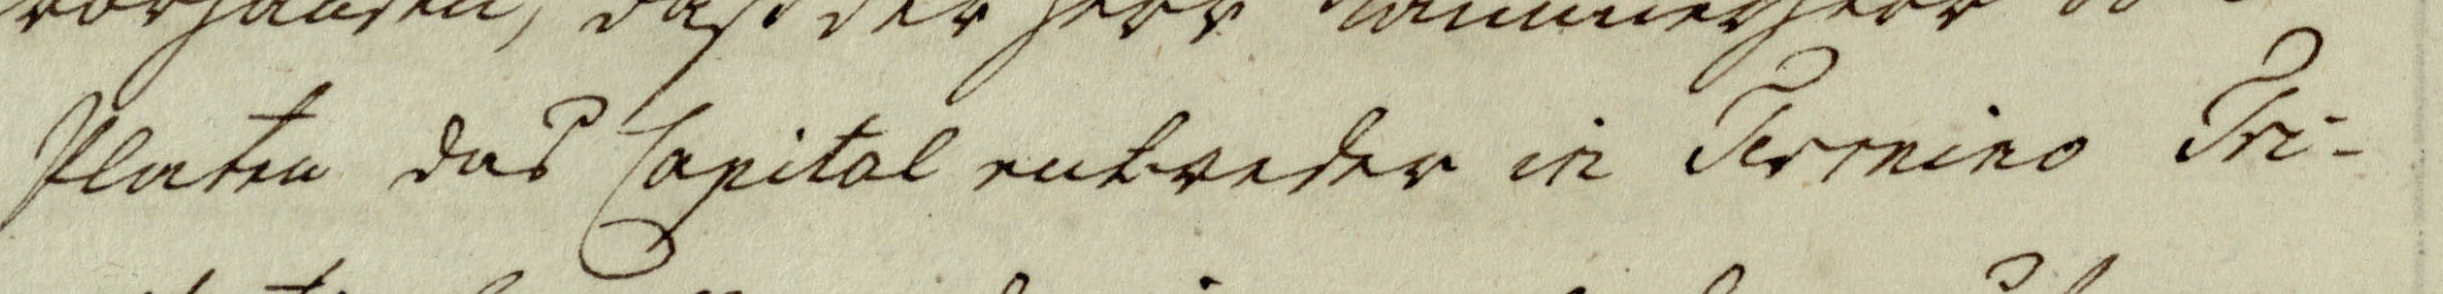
Platen das Capital entweder in Termino Tri¬
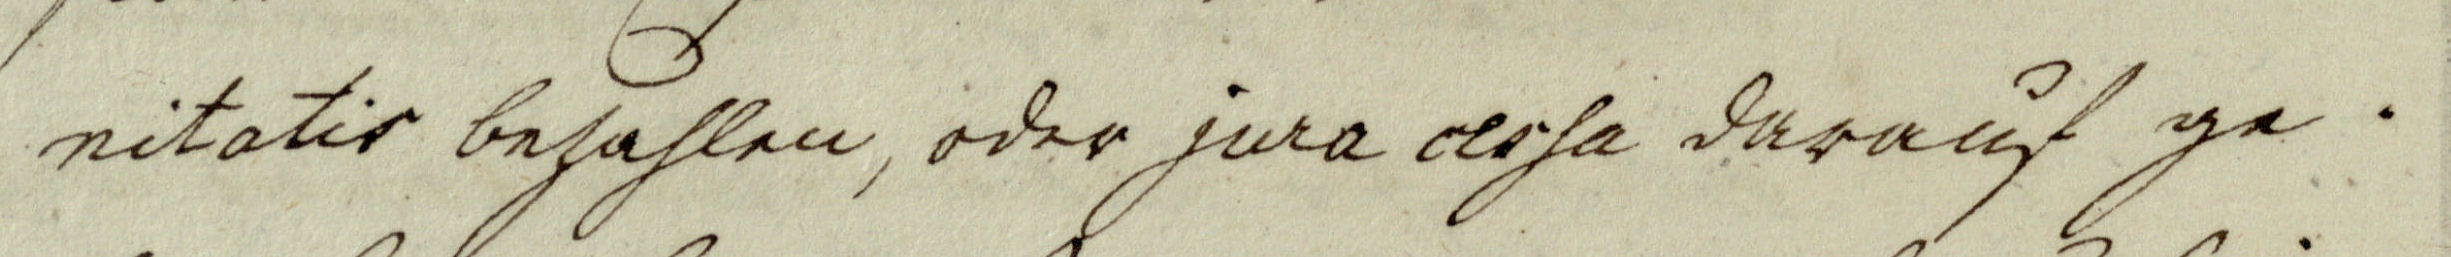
nitatis bezahlen, oder jura cessa darauf ge¬
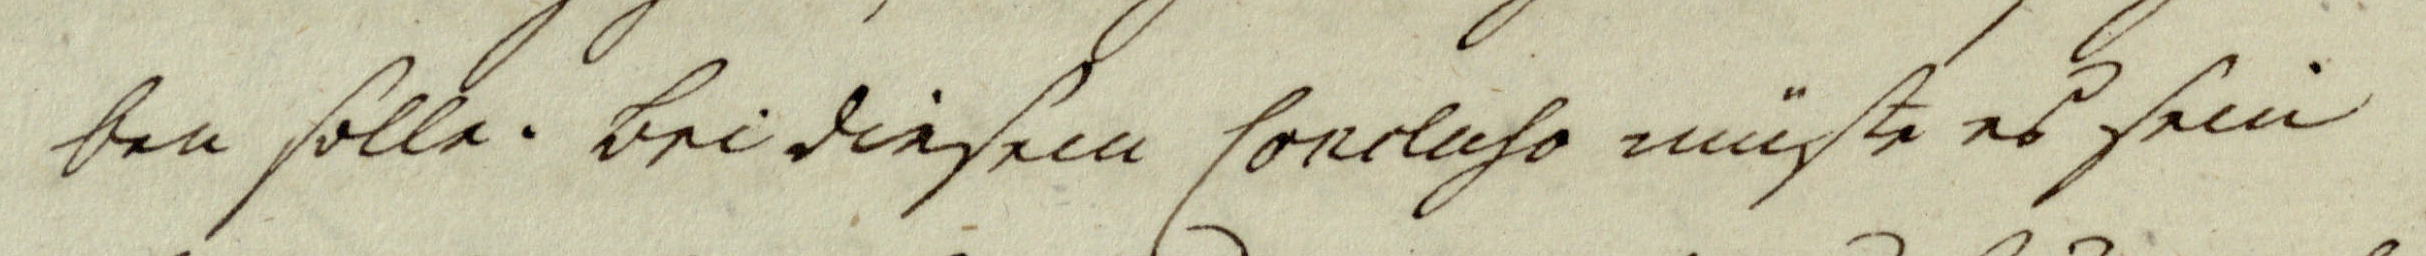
ben solle. Bei diesem Concluso müßte es sein
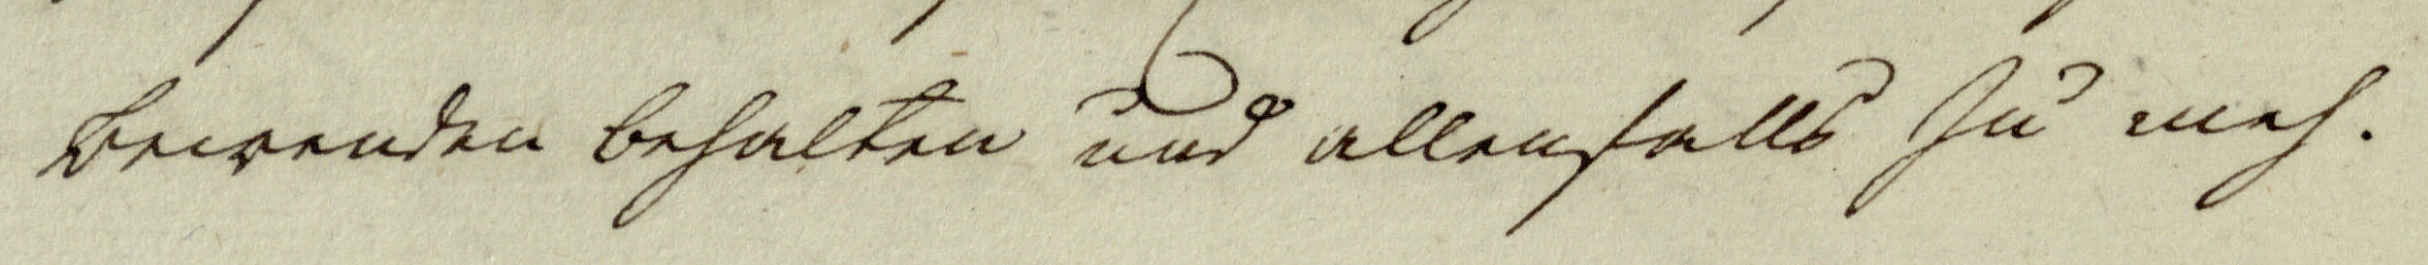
Bewenden behalten und allenfalls zu meh¬
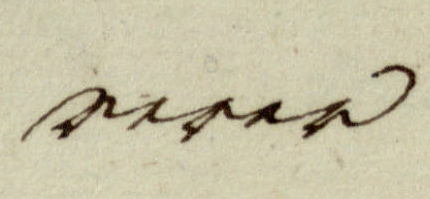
rerer
